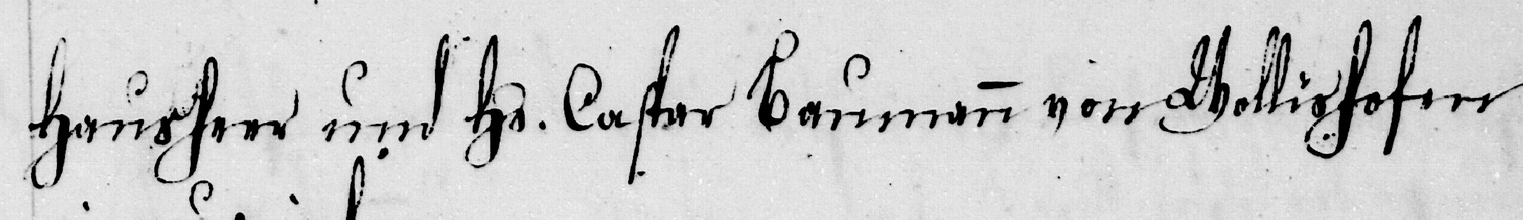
Hausheer und Hs. Caspar Baumann von Wollishofen
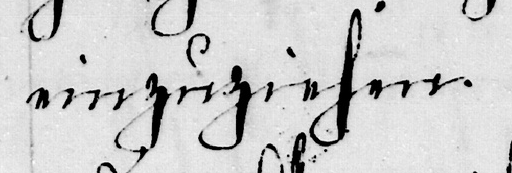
einzuziehen.
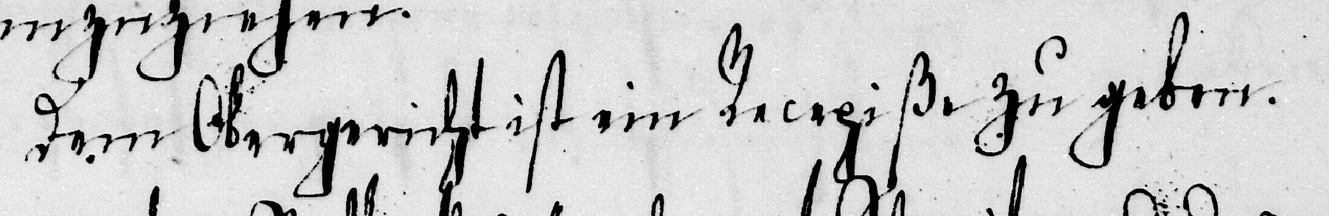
Dem Obergericht ist ein Recepiße zu geben.
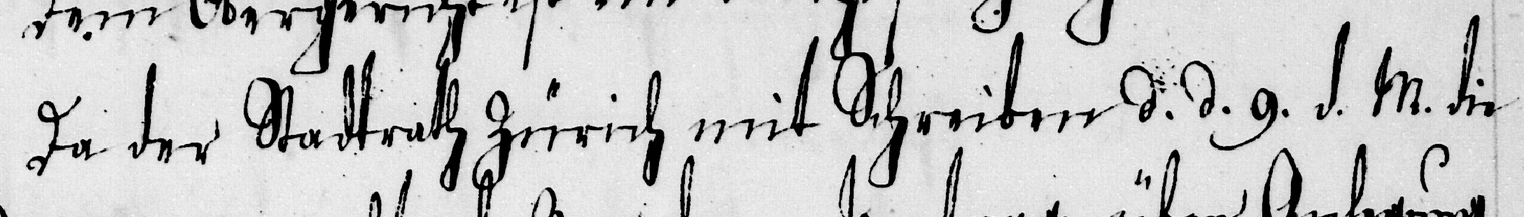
Da der Stadtrath Zürich mit Schreiben d. d. 9. d. M. die
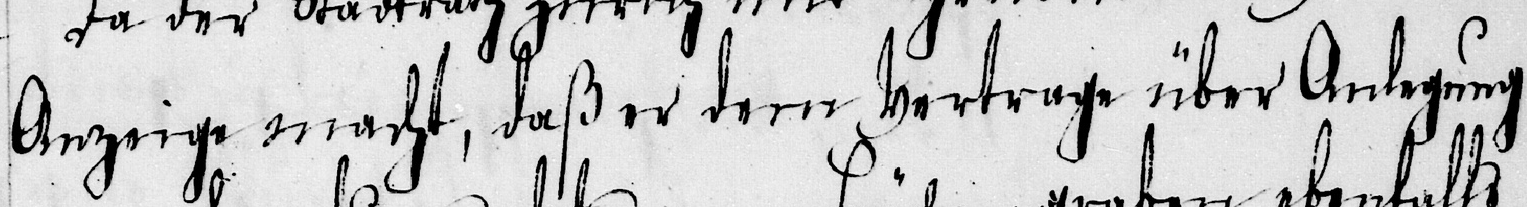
Anzeige macht, daß er dem Vertrage über Anlegung
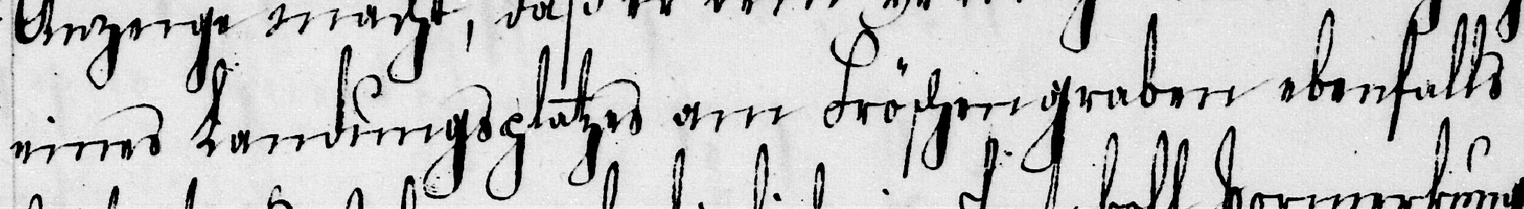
eines Landungsplatzes am Fröschengraben ebenfalls
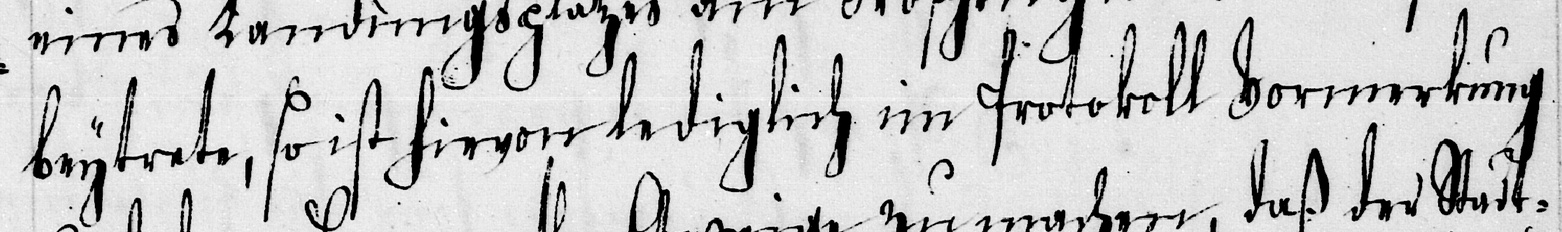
beytrete, so ist hievon lediglich im Protokoll Vormerkung
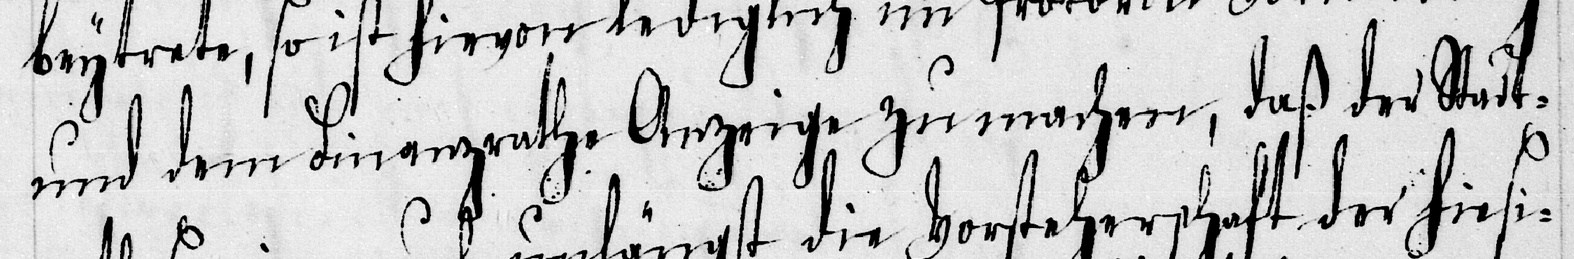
und dem Finanzrathe Anzeige zu machen, daß der Stadt¬
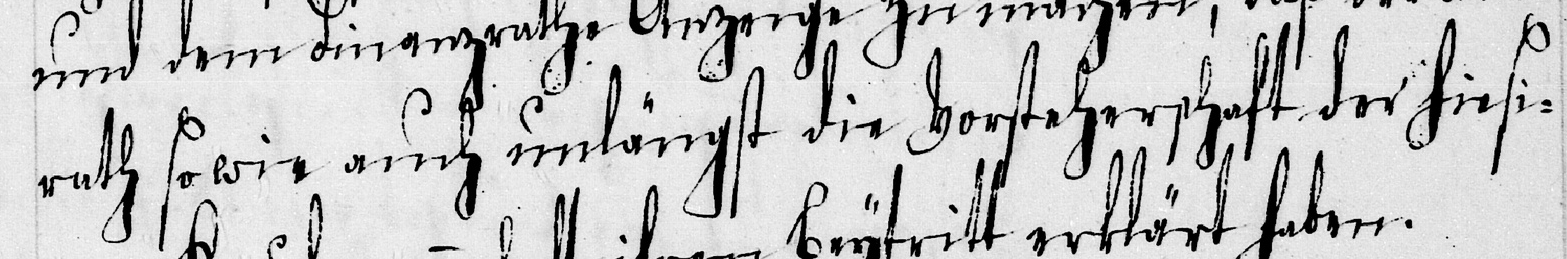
rath sowie auch unlängst die Vorsteherschaft der hiesi¬
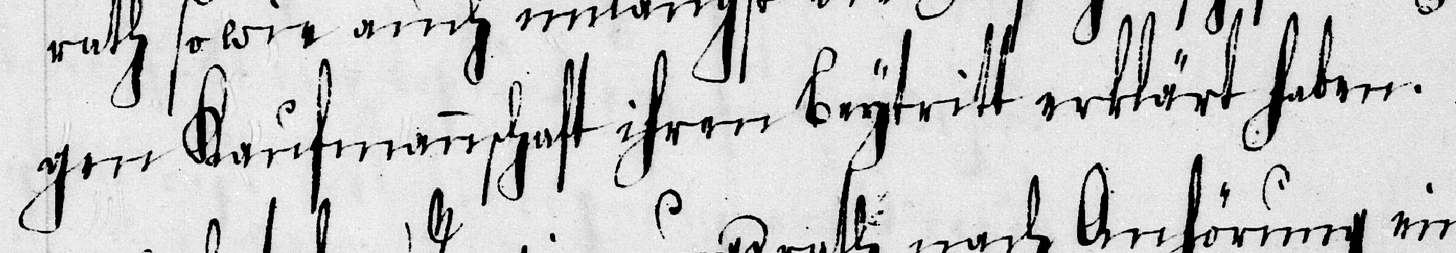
gen Kaufmannschaft ihren Beytritt erklärt haben.
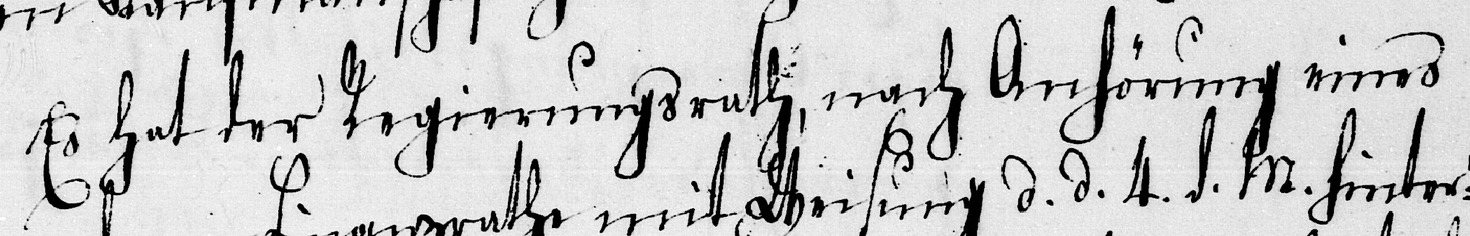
Es hat der Regierungsrath, nach Anhörung eines
